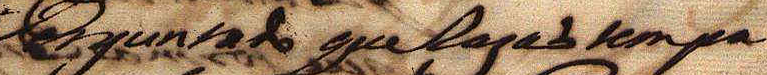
Perguntado que Razaõ tem pa
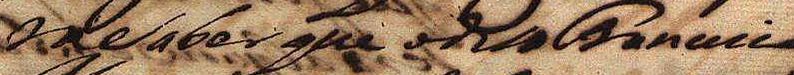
ra Saber que o dito Francisco
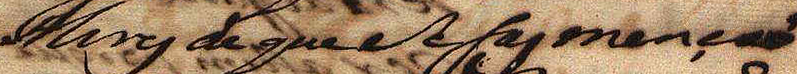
Alvres de que Se fas mençaõ
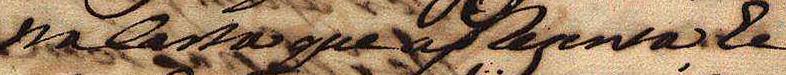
na carta que aprezenta, he
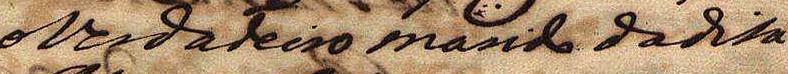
o verdadeiro marido da dita
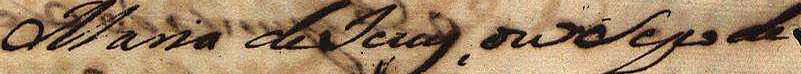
Maria de Iesus, ou se pode
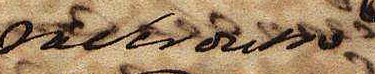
ra ser outro
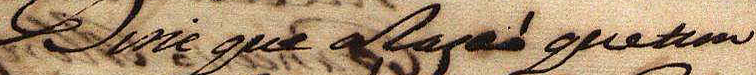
Disse que a Razaõ que tem
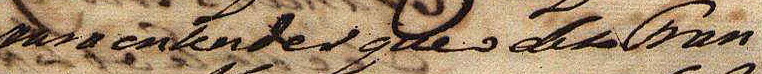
para entender que o dito Fran
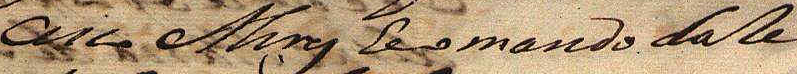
cisco Alvres he o marido da Re
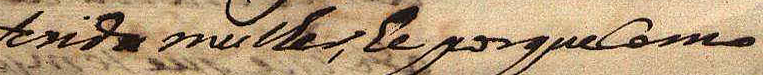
ferida mulher, he porque como
